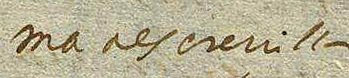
ma a escreui //
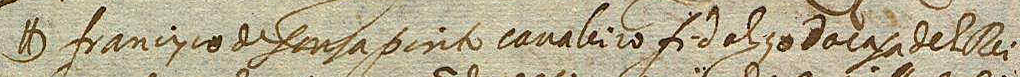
item francisco de sousa pinto caualeiro fidalgo da casa del Rei
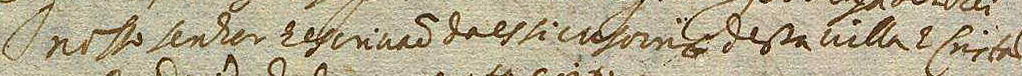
nosso senhor E escriuaõ da essicusoins desta uilla E Cristaõ
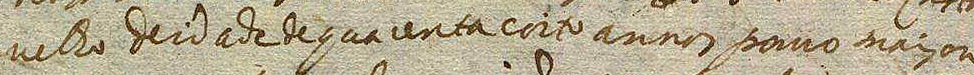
uelho de idade de quarenta e oito annos pouco mais ou
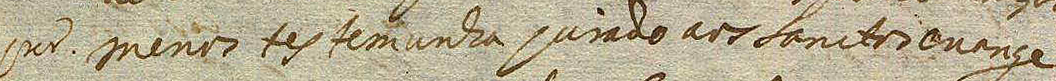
menos testemunha jurado aos sanctos euange
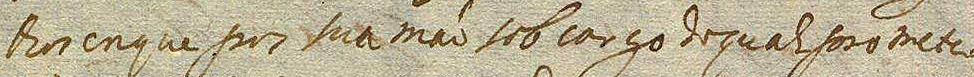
lhos en que pos sua maõ sob cargo do qual prometeo
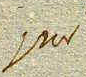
jur
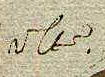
vlta.
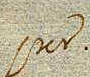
jur.
